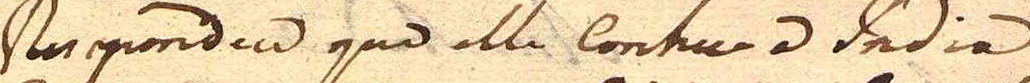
Respondeu que elle conhece a India
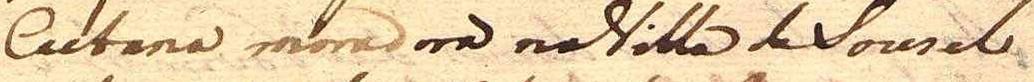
Caetana moradora na Villa de Sousel
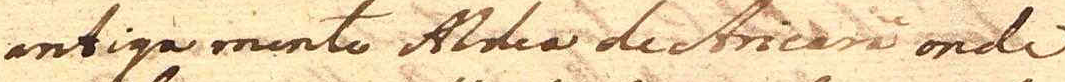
antigamente Aldea de Aricarã onde
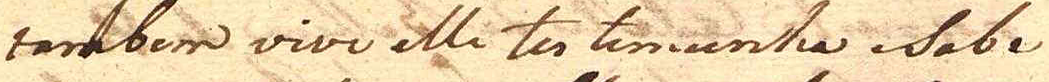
tambem vive ella testemunha e Sabe
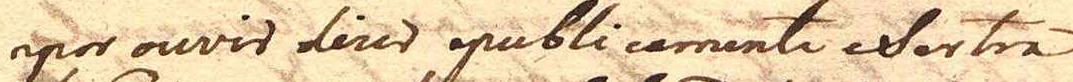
por ouvir dizer publicamente a Ser tra
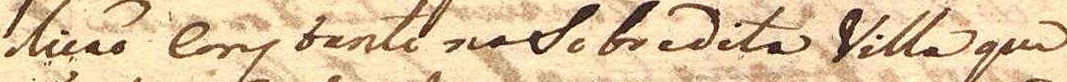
diçaõ constante na Sobredita Villa que
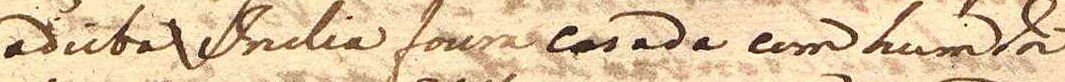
a dicta India foura casada com hum In
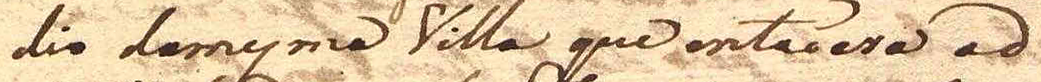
dio da mesma Villa que entaõ era ad
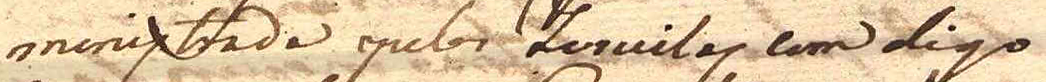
ministrada pelos Zesuilas com digo
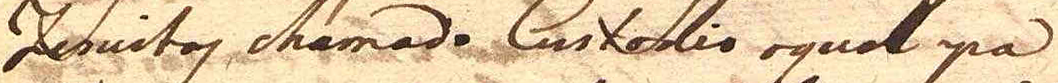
Zesuitas chamado Custodio o qual pa
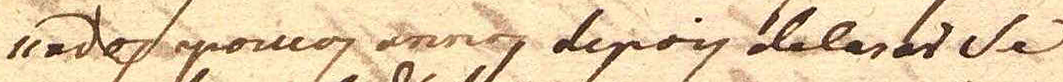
ssados poucos annos depois de casar se
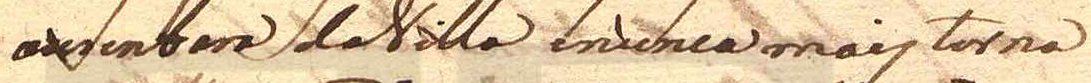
ausentara da Villa e nunca mais torna
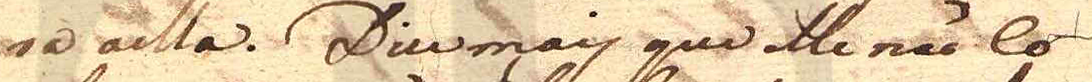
ra a ella. Dice mais que elle naõ Co
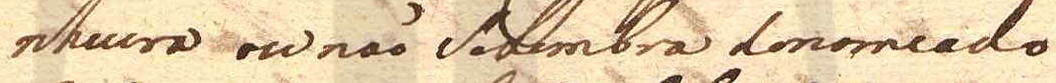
nhecera ou naõ Se lembra do nomeado
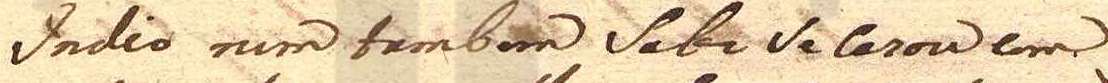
Indio nem tambem Sabe se cazou com
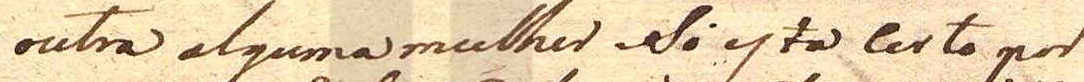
outra alguma mulher. Só esta certo por
